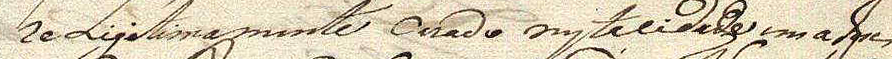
he Ligitimamente cazado nesta cidade em a Igre
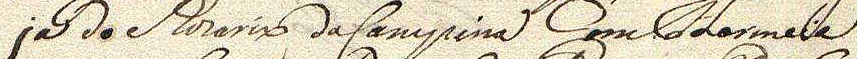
ja do Rozario da Campina Com Florencia
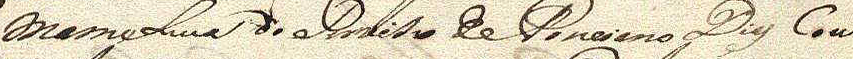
MameLuca do Serviso de Ponciano Dias Cou
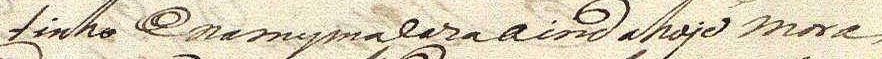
tinho e na mesma Caza ainda hoje mora
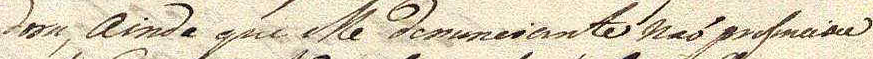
dora, ainda que elle denunciante naõ presenciou
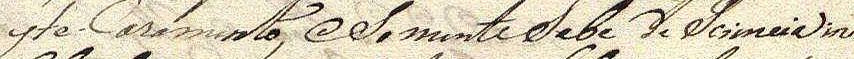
este Casamento, e Somente Sabe de Sciencia in
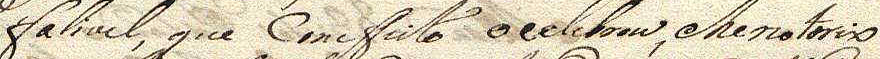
falivel, que Com effeito o celebrou, e he notorio
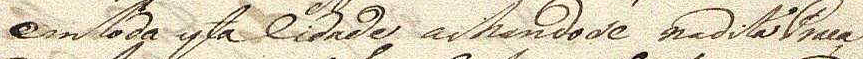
em toda esta Cidade achandose na dita Praça
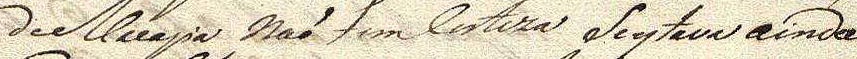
de Macapá naõ tem Certeza se estava ainda
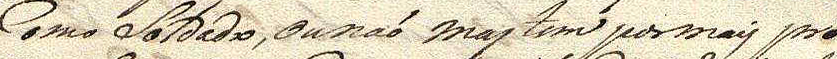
Como Soldado, ou naõ mas tem por mais pro
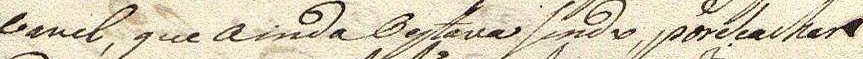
vauel, que ainda O estava sendo, por se achar
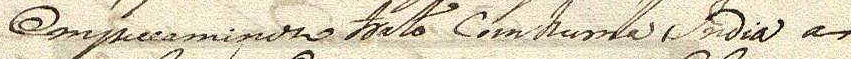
em pecaminozo trato Com huma India a
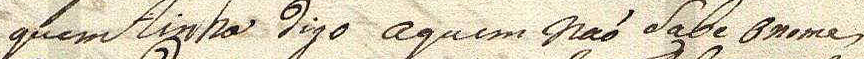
quem tinha digo a quem não Sabe o nome
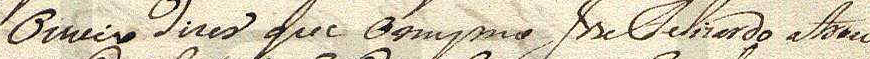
Ouvira dizer que o mesmo Joze Felizardo a trou
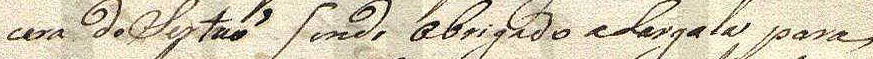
cera do Sertaõ sendo obrigado a Largala para,
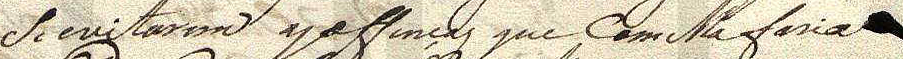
se evitarem as offenças que Com ella fazia
